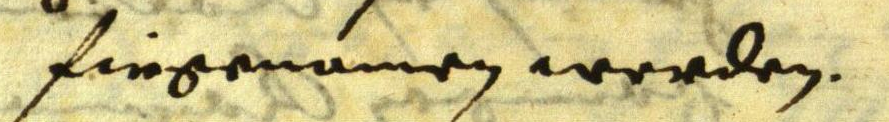firgenomen werden.
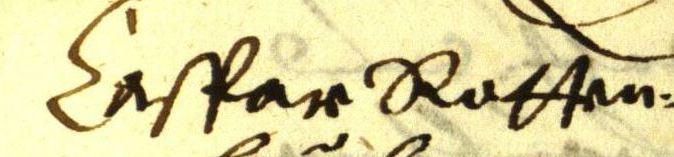Caspar Rotten¬
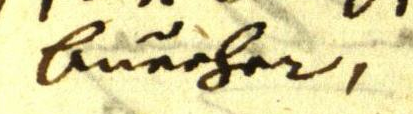būecher,
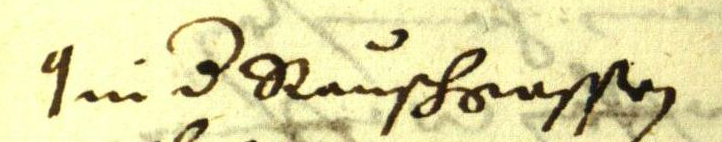in d Rauschgassen
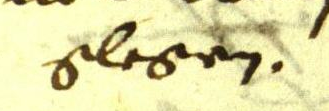glegen.
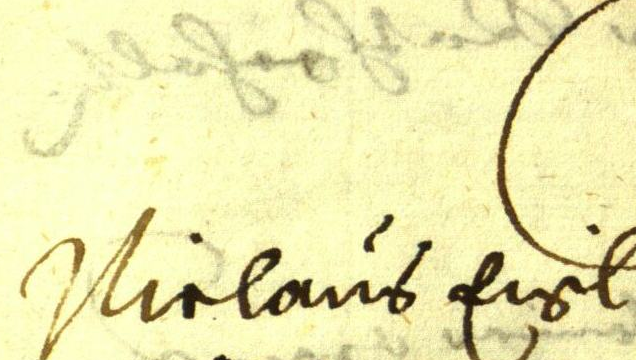Niclaūs Eigl¬
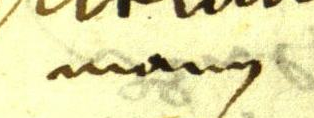mann
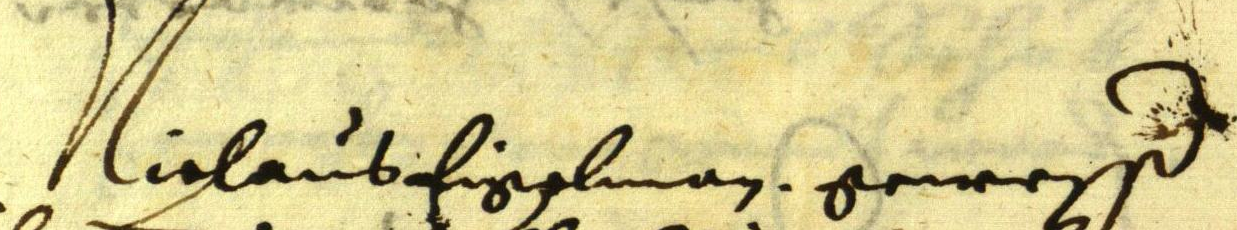Niclaūs Eigelman. gewesst
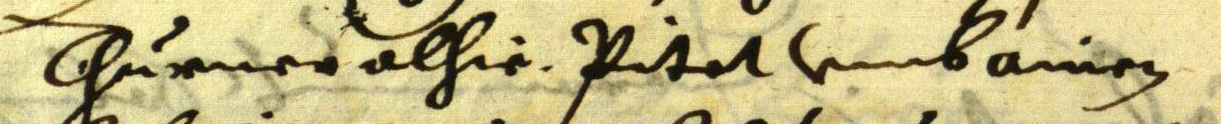Thūrner alhie. Pitet vmb ainen
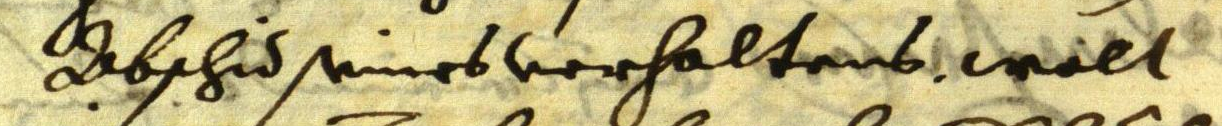Abschid seines verhaltens. wolt
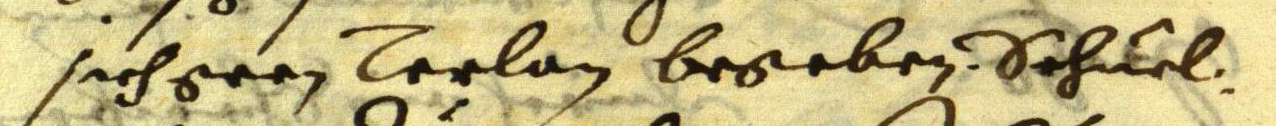sich geen Terlan begeben. Schūel¬
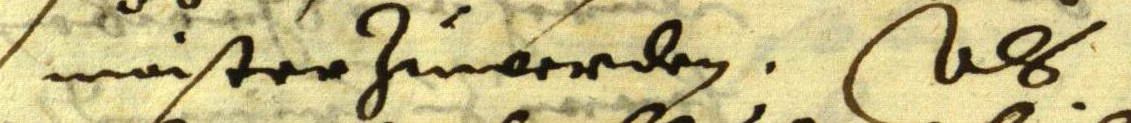maister Zūwerden. Als
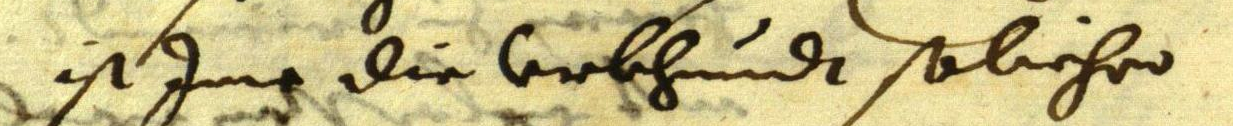ist Ime die vrkhūndt solicher
